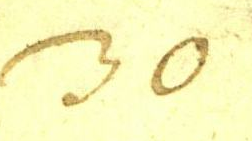30
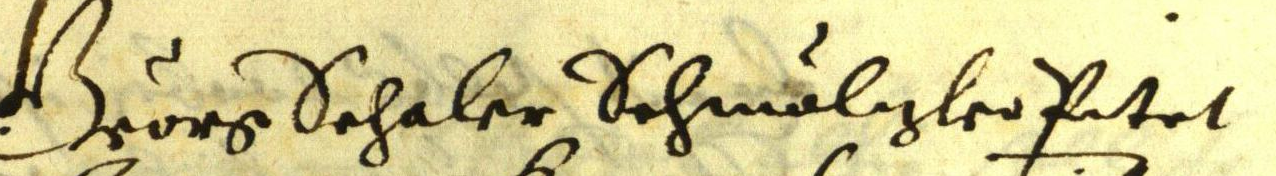Georg Schaler Schmōlzler Pitet
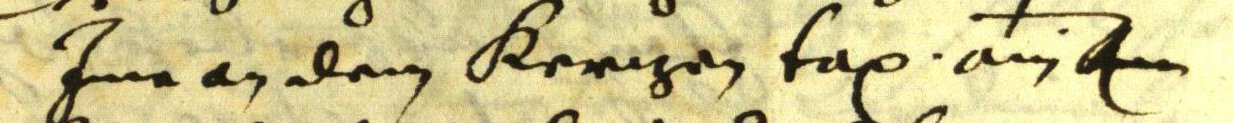Ime an dem Kerzen tax. ainem
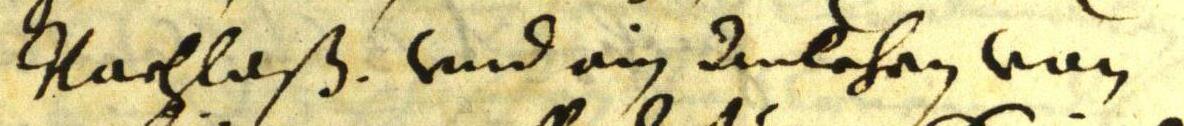Nachlaß. vnd ain Anlehen von
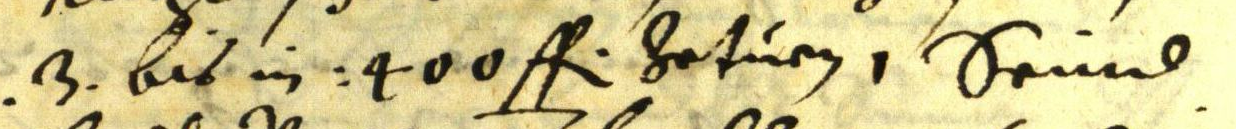.3. bis in: 400 fl. Zetūen, Seind
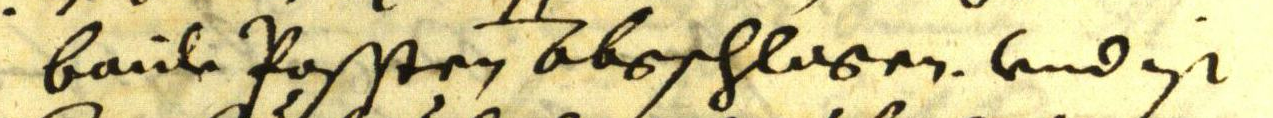baide Possten Abgschlagen. vnd ist
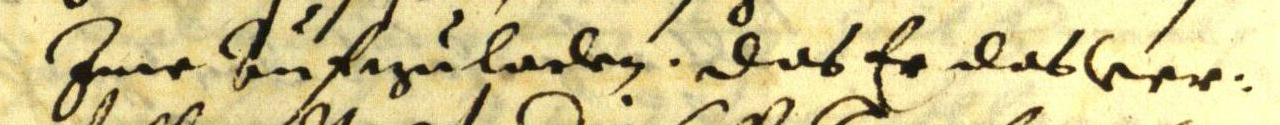Ime Aūfzūladen. das Er das ver¬
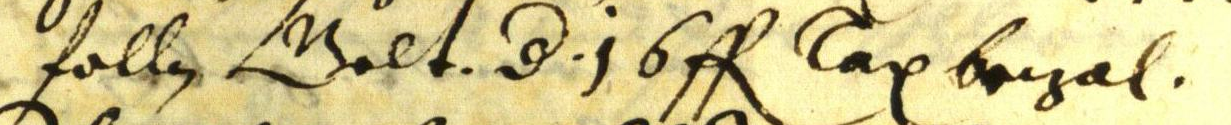falln Gelt. d 16 fl Tax bezal.
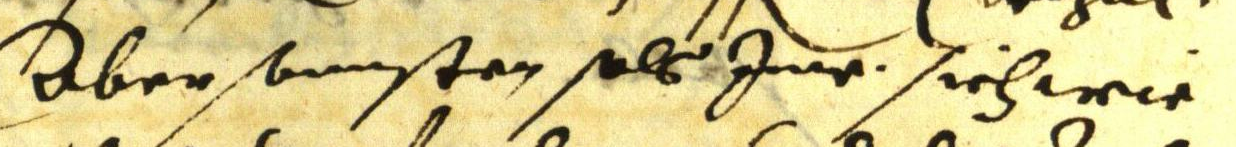Aber sonsten sols Ime. sich wie
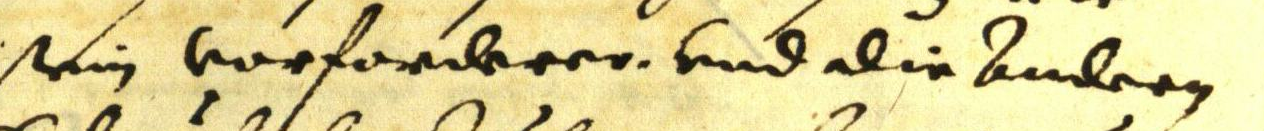sein vorforderer. vnd die Andern
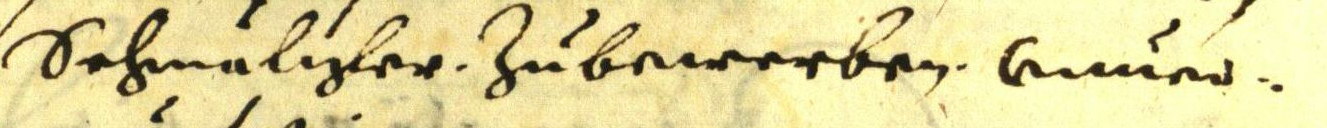Schmōlzler. Zū bewerben. vnvūer¬
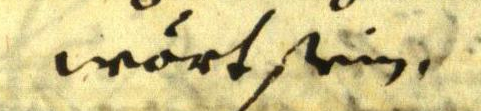wort sein.
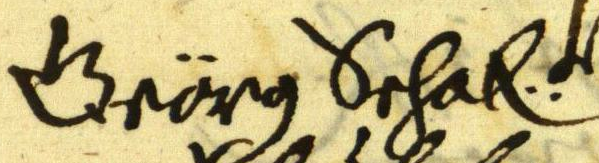Geörg Schal¬
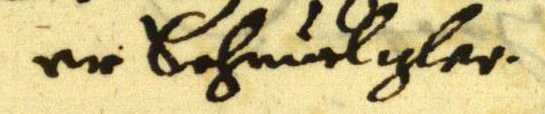er Schmōelzler.
